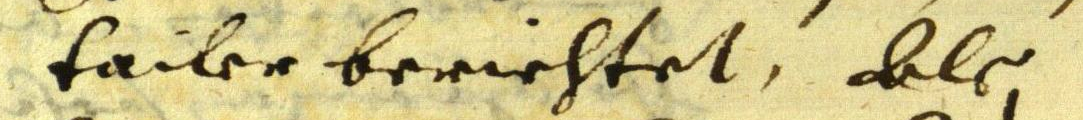tailer berichtet, Als
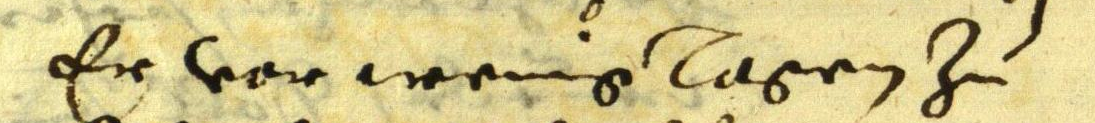Er vor wenig Tagen Zū
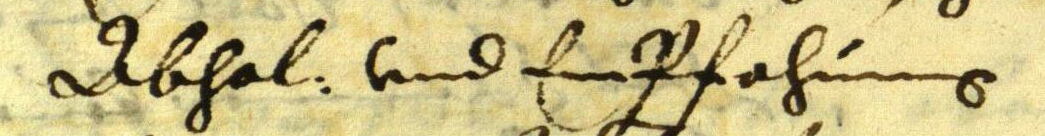Abhol: vnd EmPfahūng
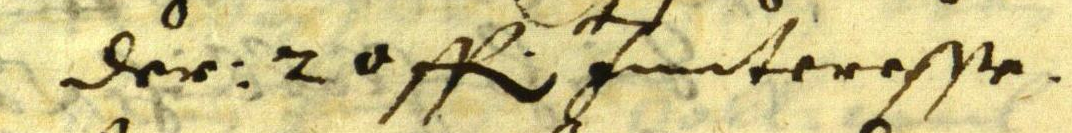der: 20 fl. Innteresse.
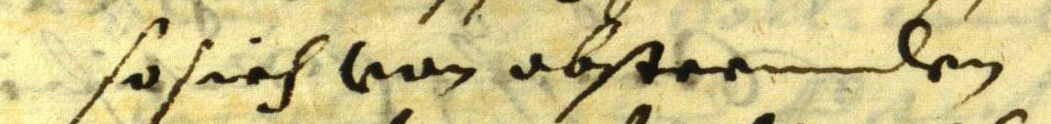so sich von obsteennden
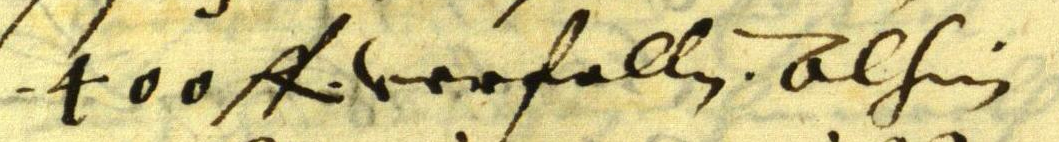.400 fl. verfalln. Alhin
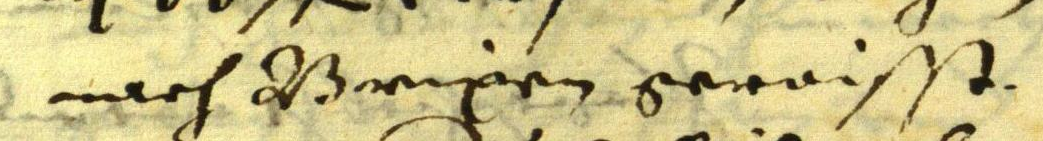nach Brixen geraisst.
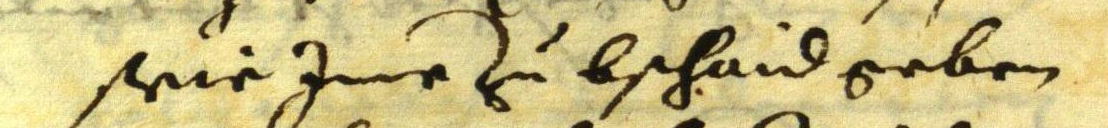seie Ime Zū bschaid geben
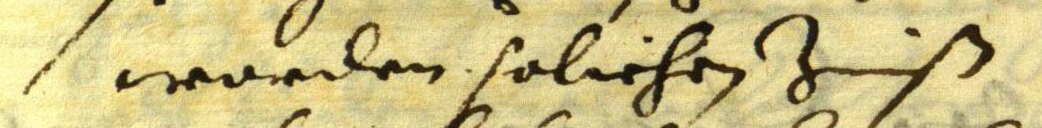worden solichen Zinß
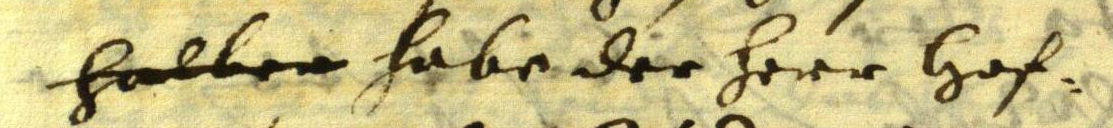halber habe der herr Hof¬
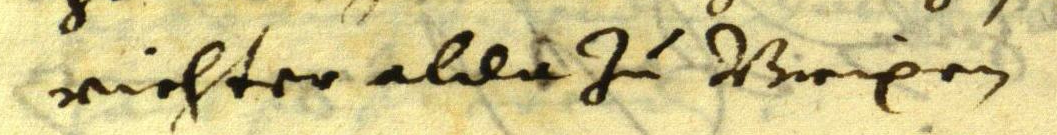richter alda zū Brixen
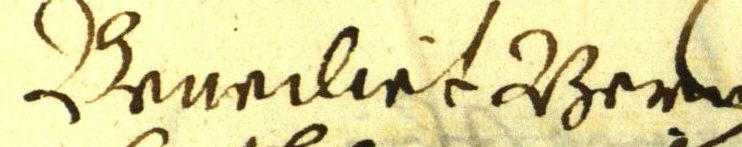Benedict Bern¬
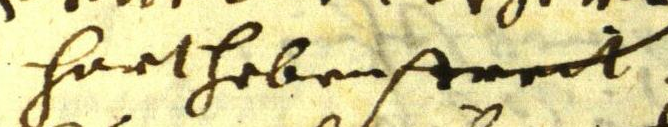hart hebenstreit
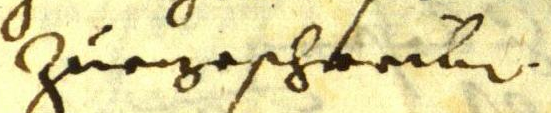Zūezeschreiben.
